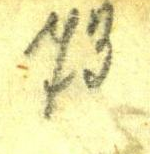73
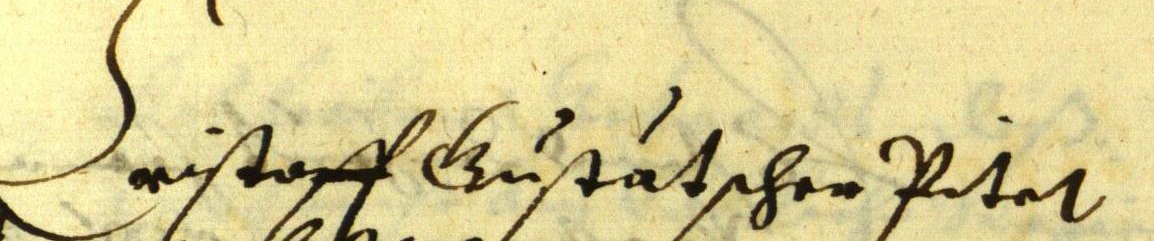Cristoff Gūstātscher Pitet
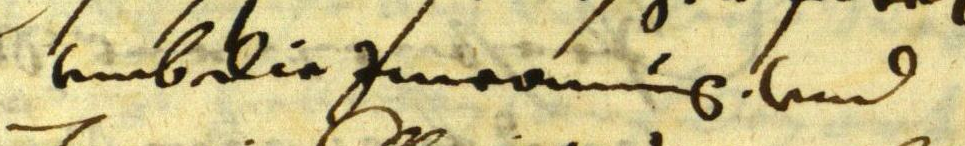umb die Inwonūng. vnd
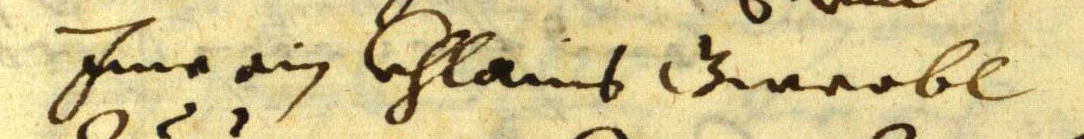Ime ain khlains Gwerbl
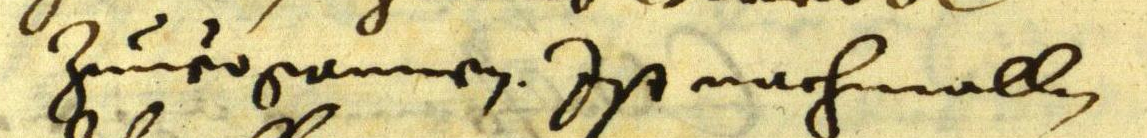Zūuērgonnen. Ist nochmalln
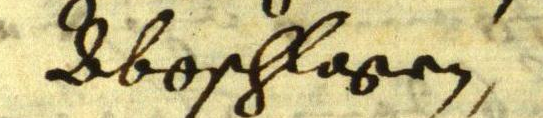Abgschlagen,
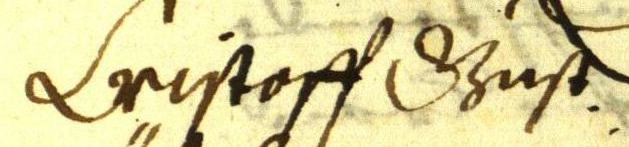Cristoff Gūst¬
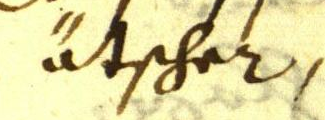ätscher,
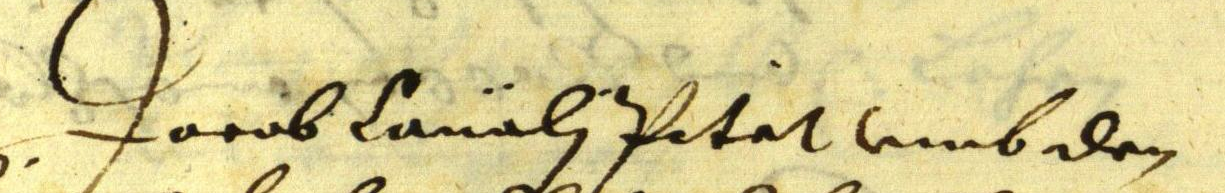Jacob Canälj Pitet umb den
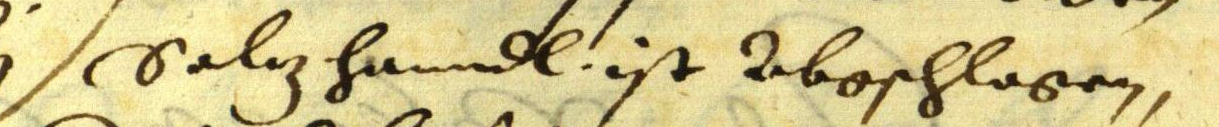Salz hanndl. ist Abgschlagen,
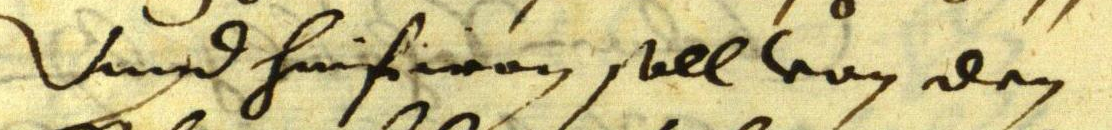Vnnd hinfiran soll von den
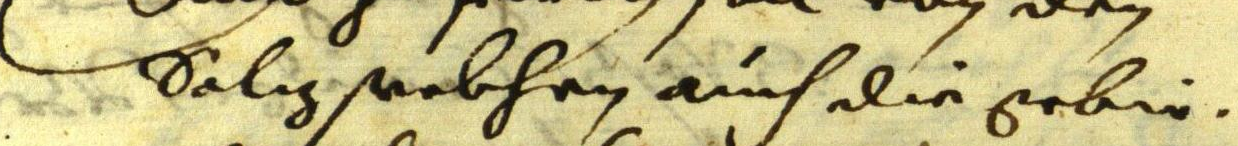Salz seckhen aūch die gebir.
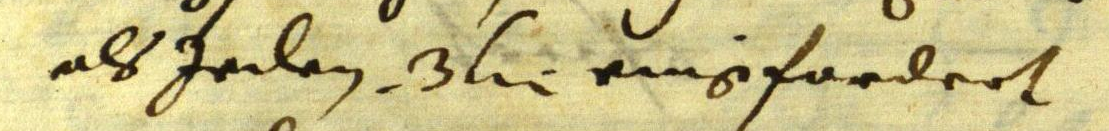als Jeden .3 k. eingfordert
